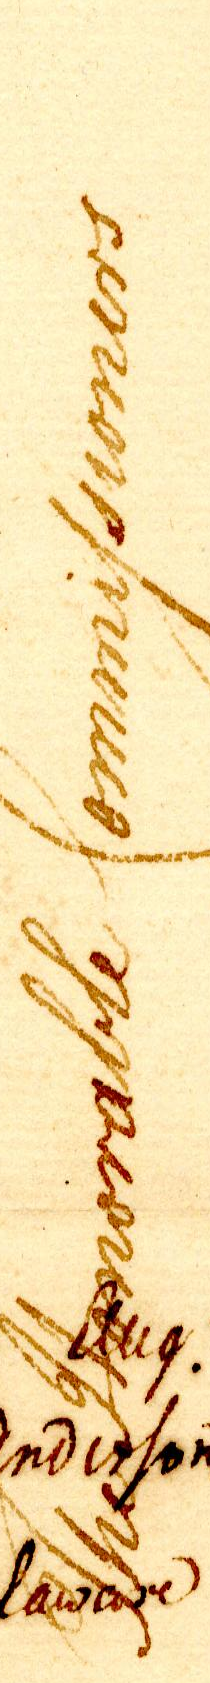The Honorable Commissioners
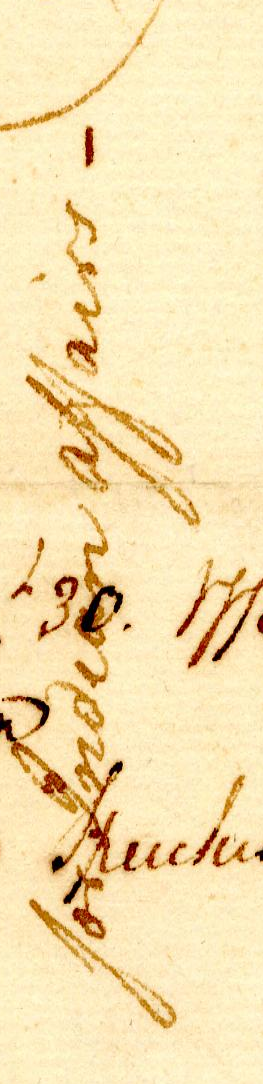for Indian affairs-
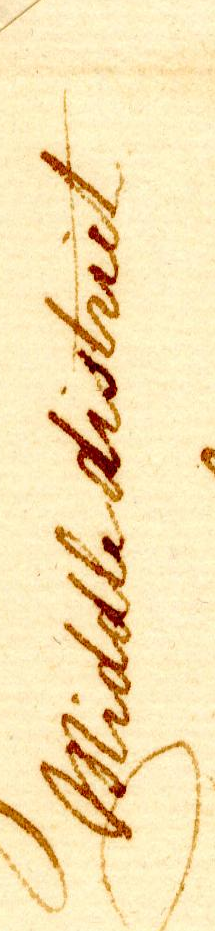Middle district
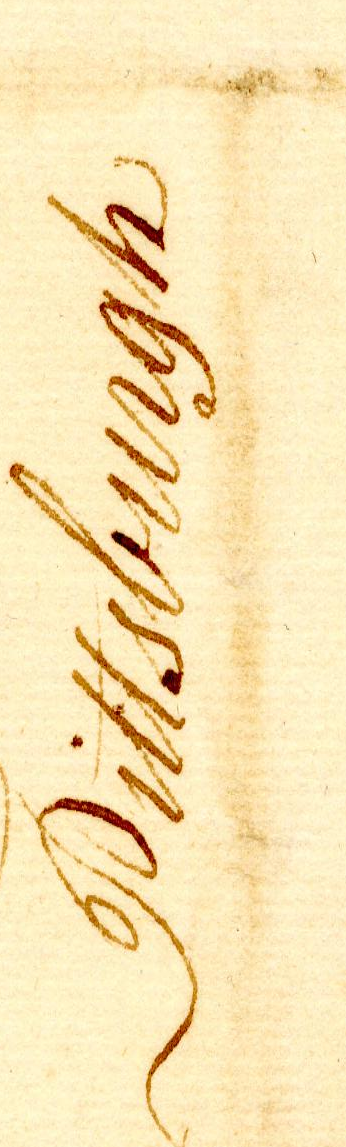Pittsburgh
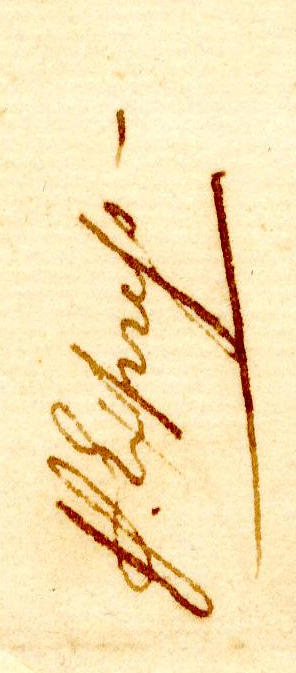Per Express-
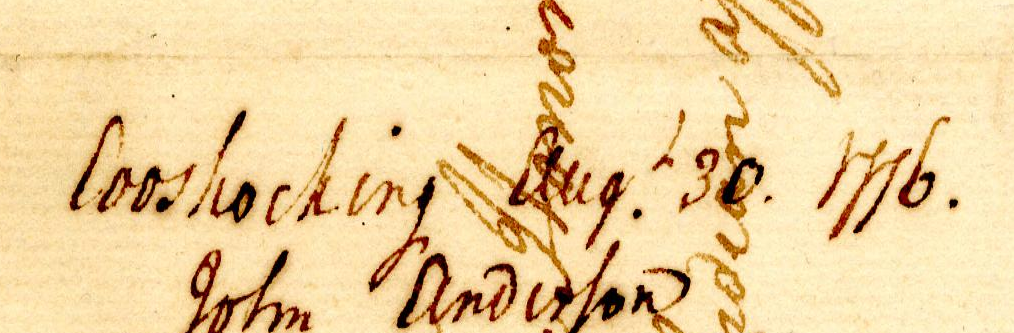Cooshocking Aug^t. 30. 1776.
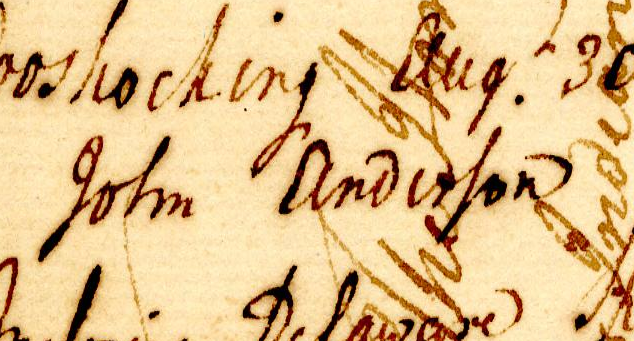John Anderson
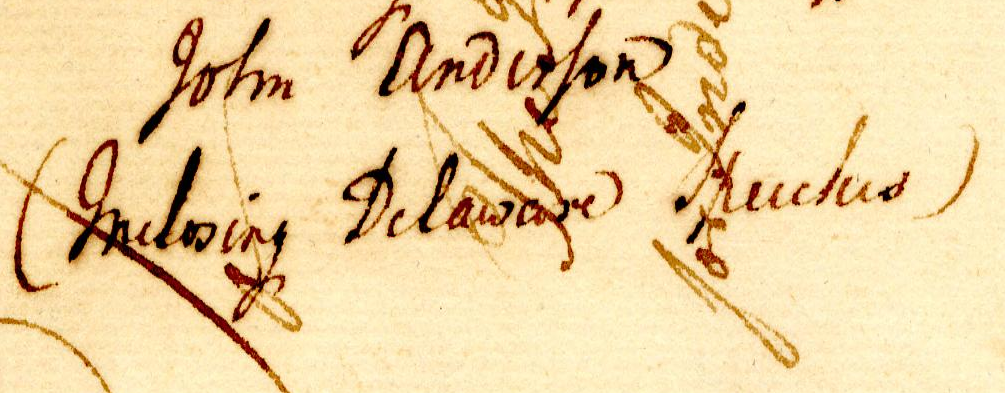(Inclosing Delaware Speeches)
